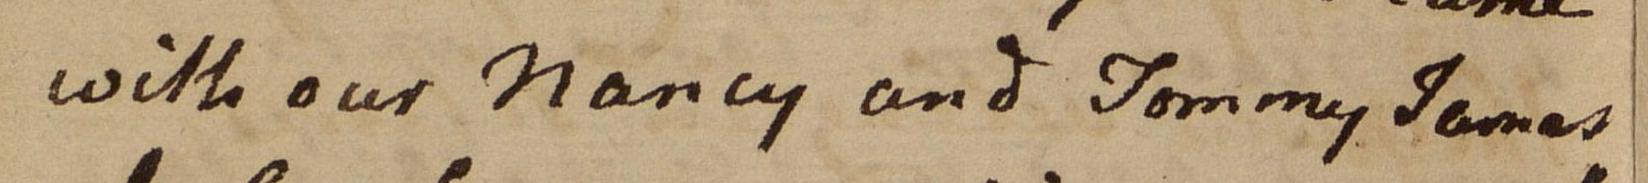with our Nancy and Tommy James,
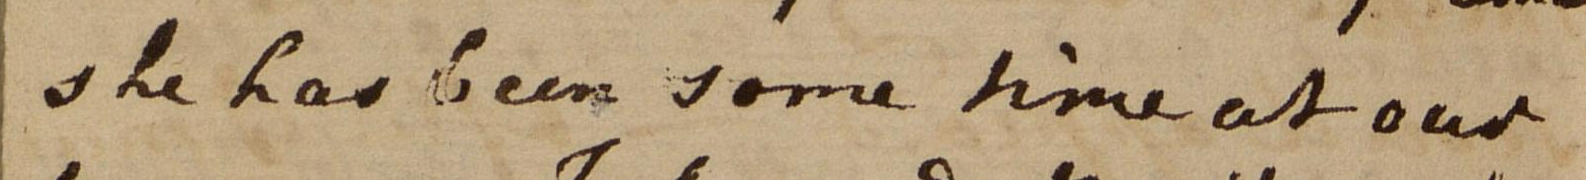she has been some time at our
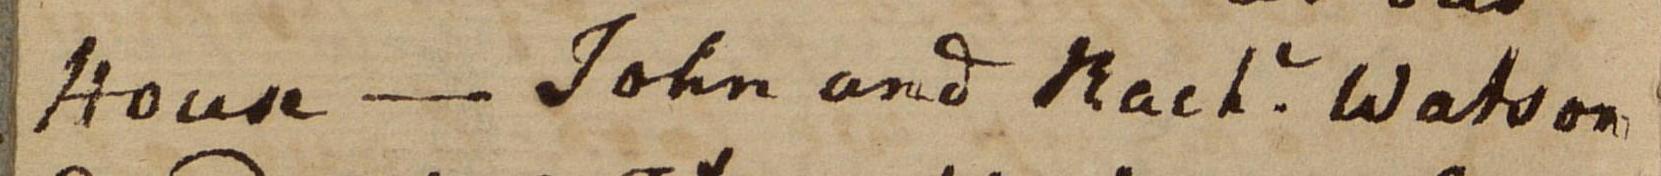House- John and Rach^l. Watson
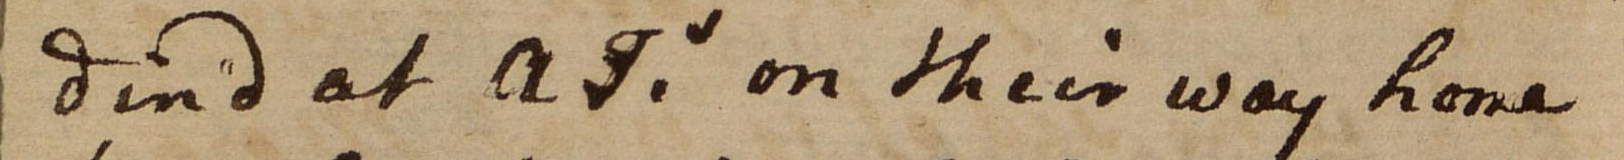din'd at AJ^s, on their way home
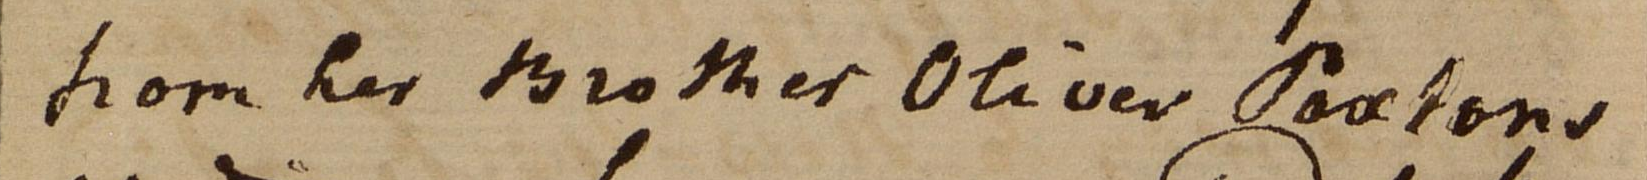from her Brother Oliver Paxtons
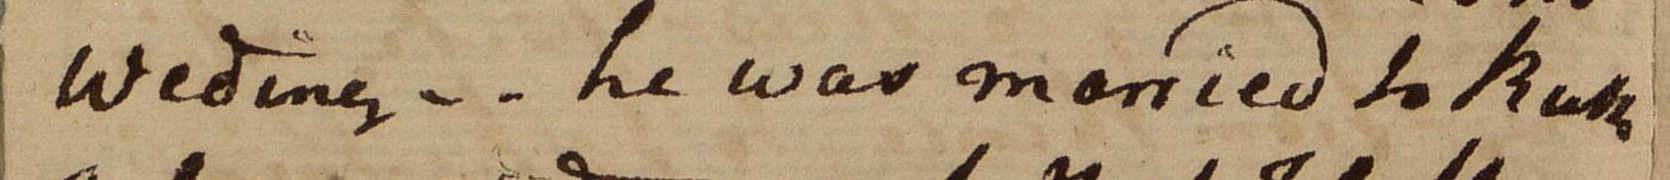Weding-- he was married to Ruth
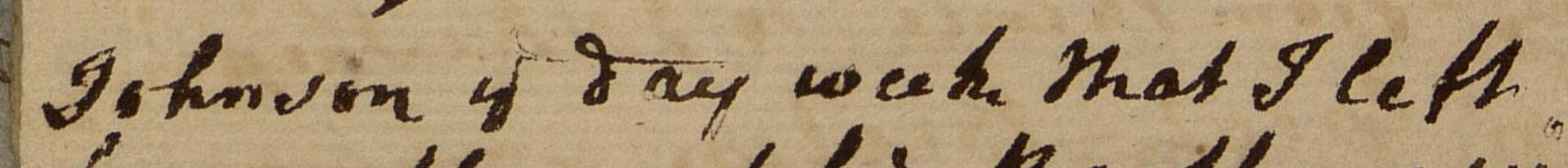Johnson y^e day week that I left
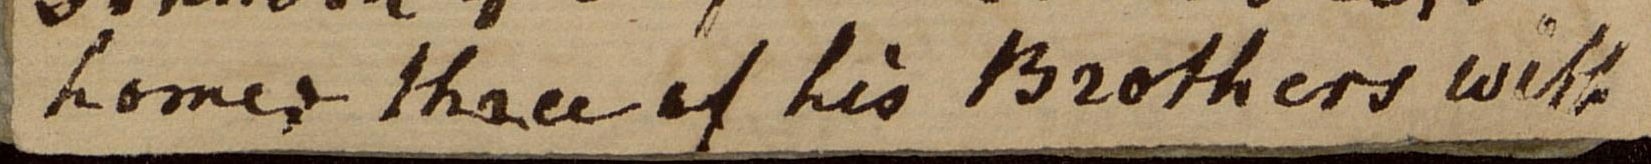homes three of his Brothers with
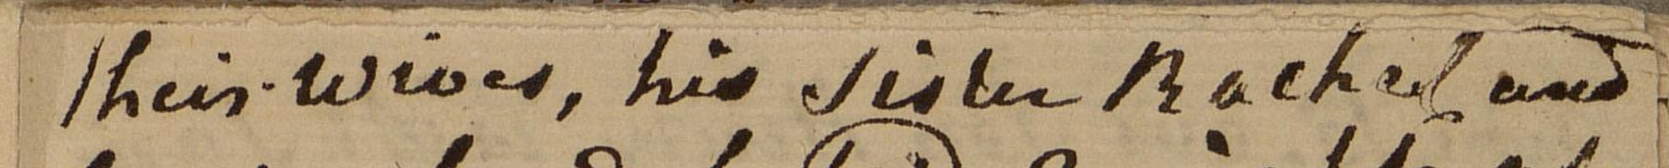their Wives, his Sister Rachel and
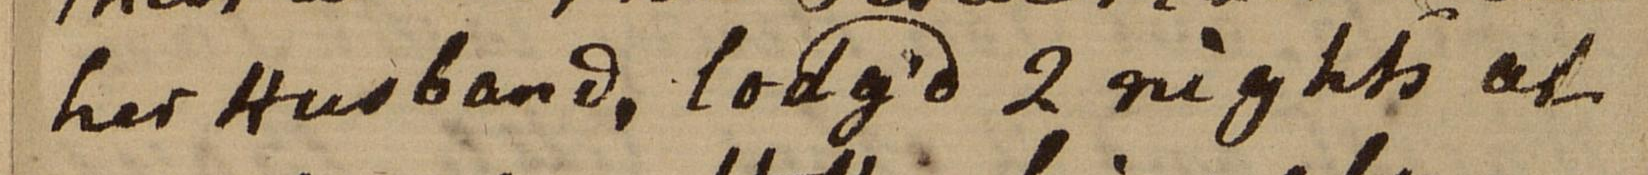her Husband, lodg'd 2 nights at
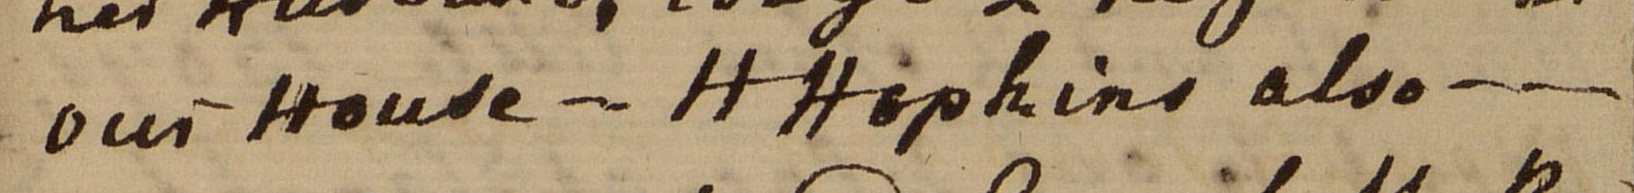our House- H Hopkins also-
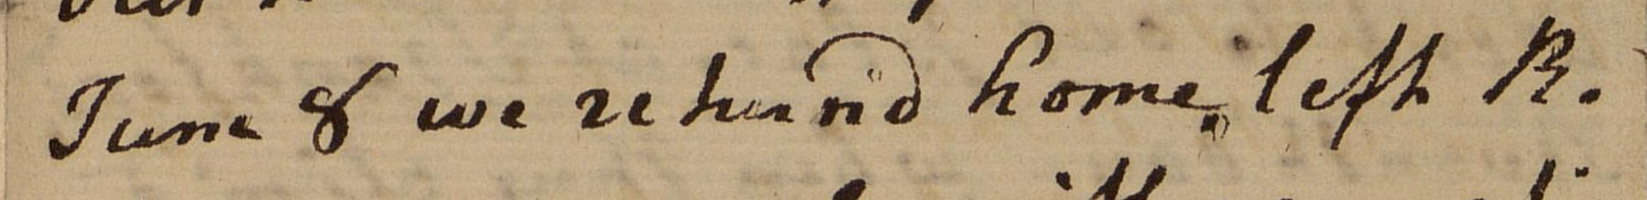June 8 we return'd home left R.
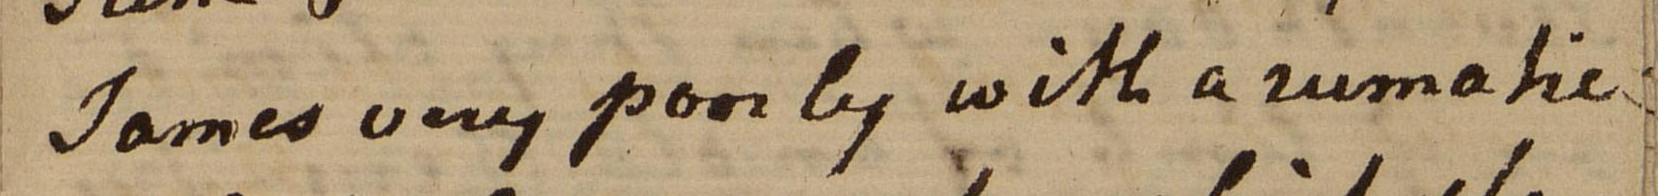James very poorly with a rumatic
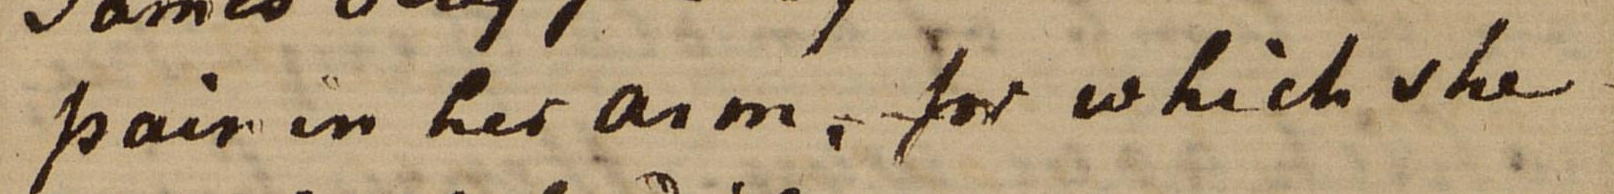pain in her arm, for which she
